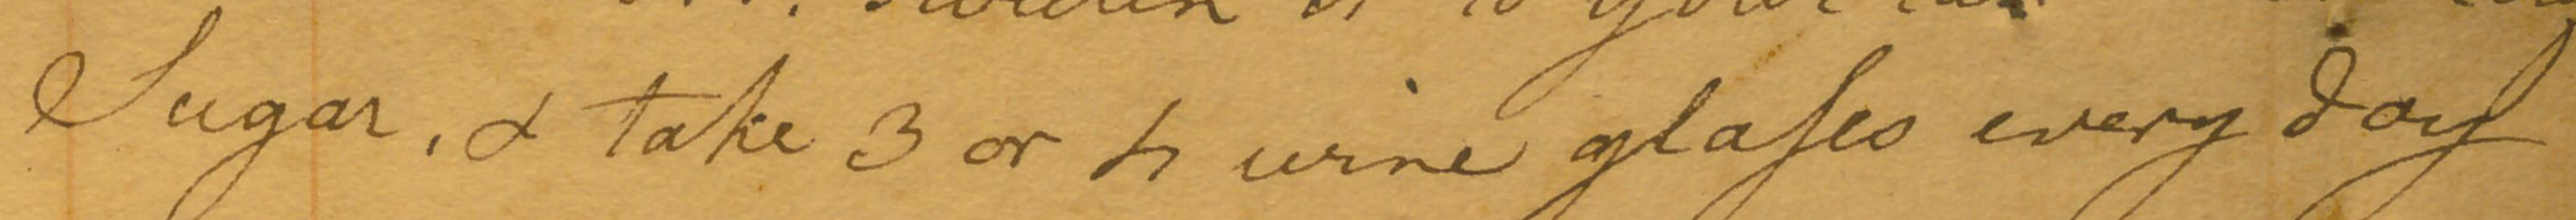Sugar, & take 3 or 4 wine glasses every day
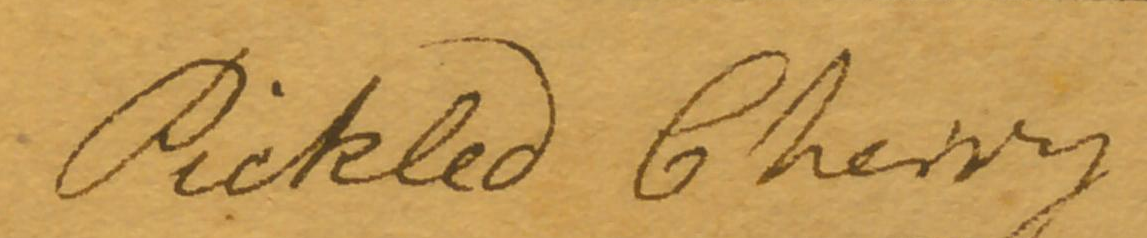Pickled Cherry
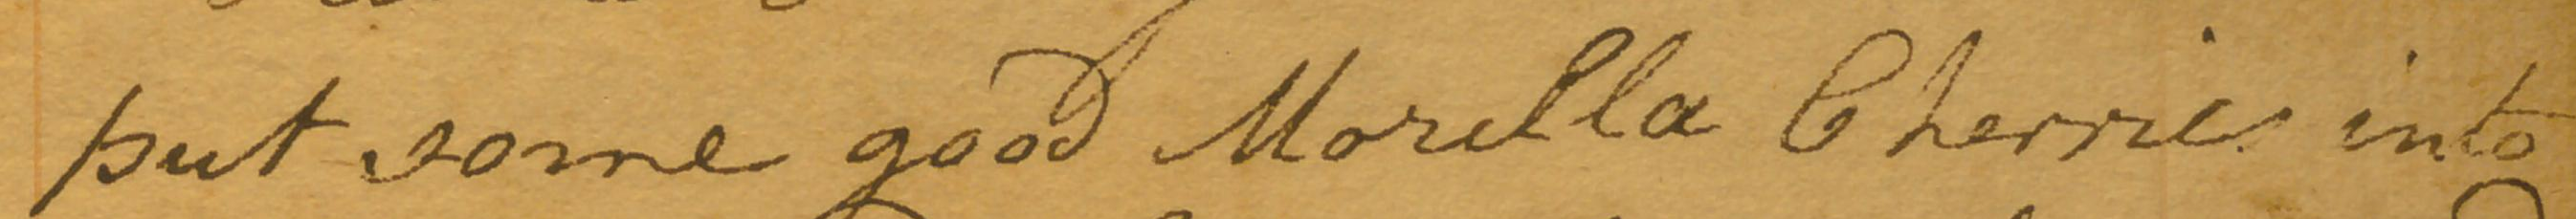put some good Morella Cherries into
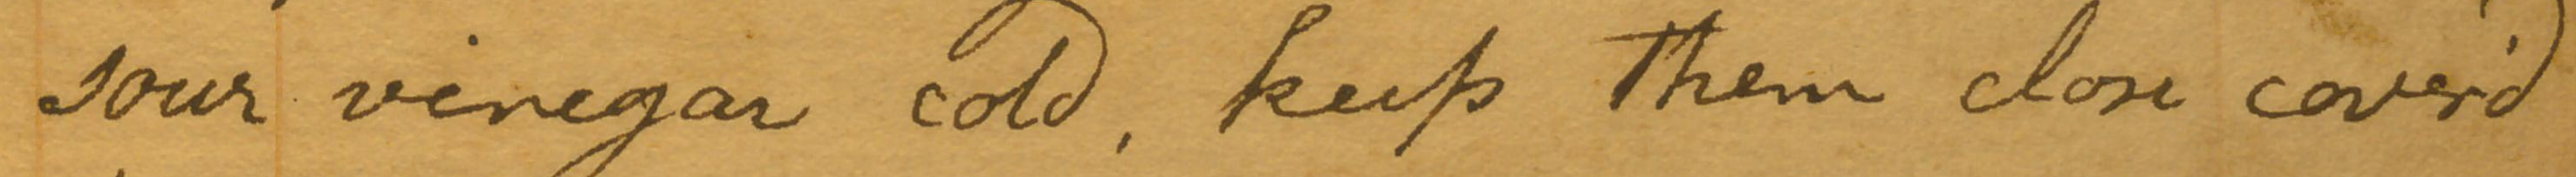sour vinegar cold, keep them close cover'd
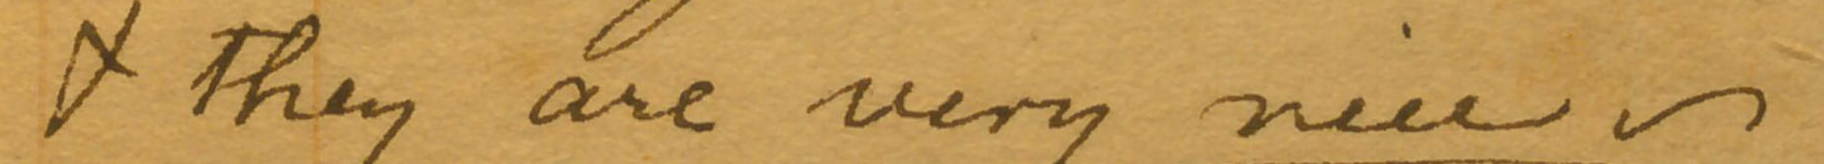& they are very nice-
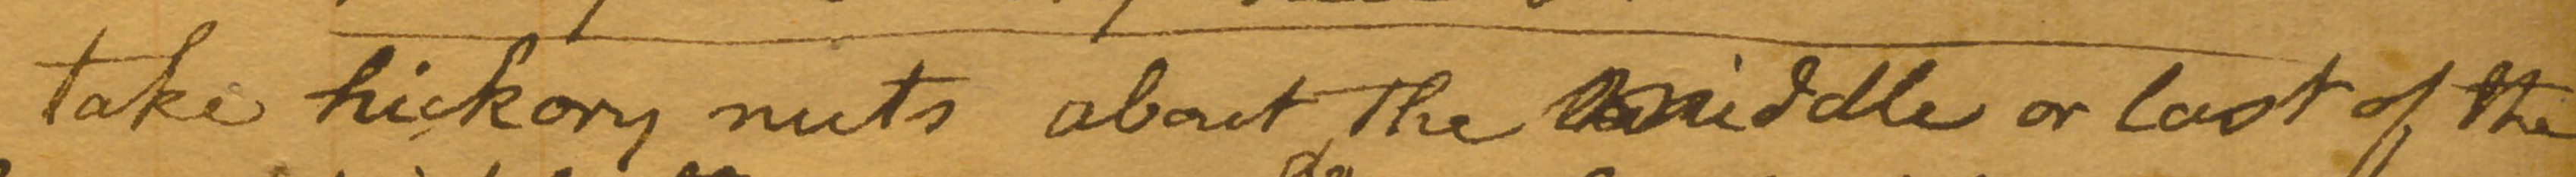take hickory nuts about the middle or last of the
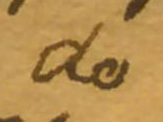do
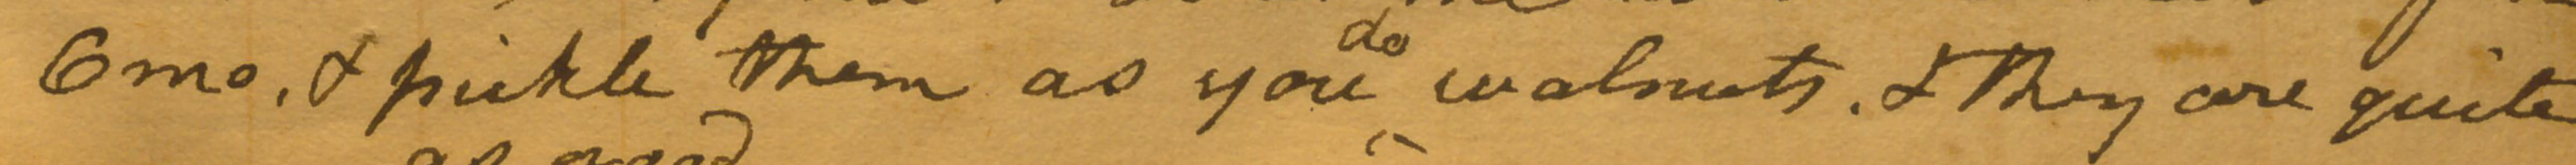6 mo, & pickle them as you ^ walnuts, & they are quite
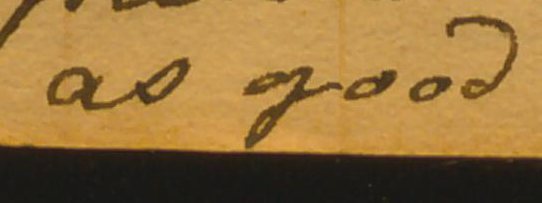as good
